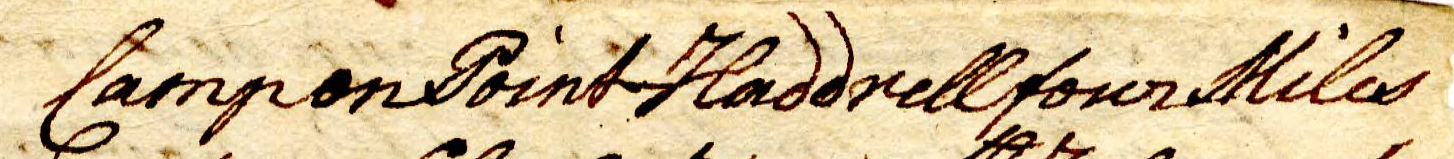Camp on Point Haddrell four Miles
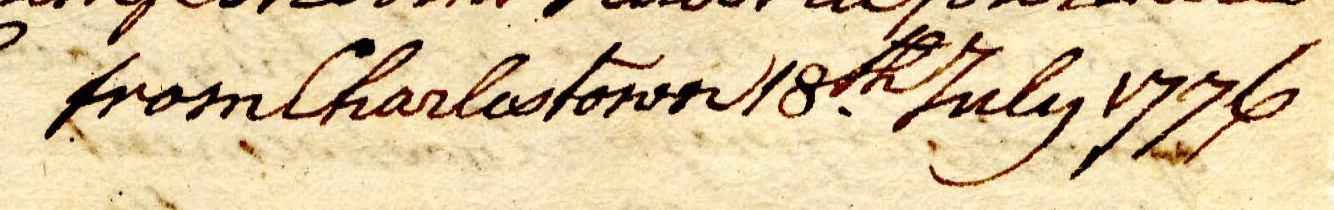from Charlestown 18^th. July 1776
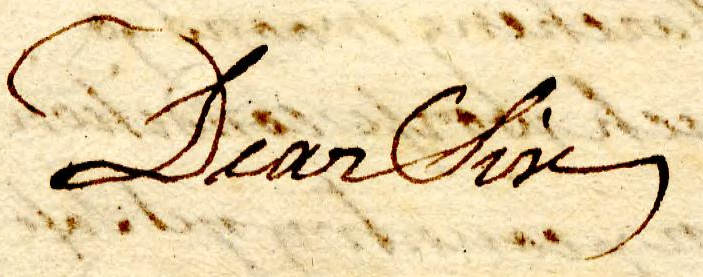Dear Sir
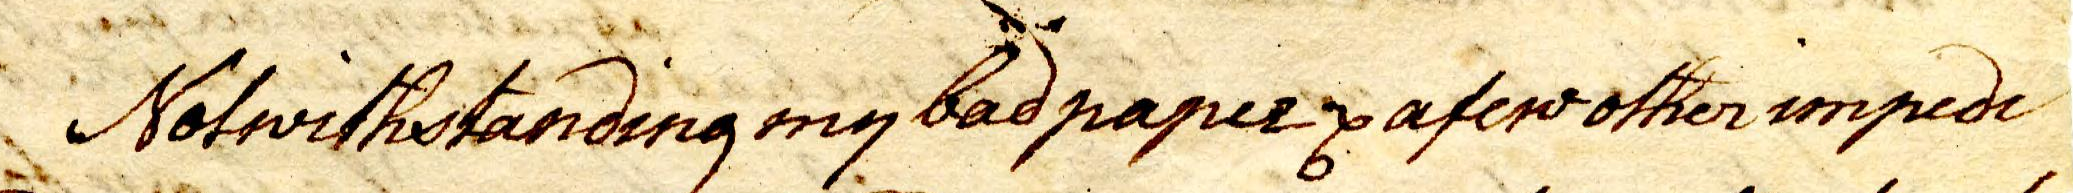Netwithstanding my bad paper & a few other impedi
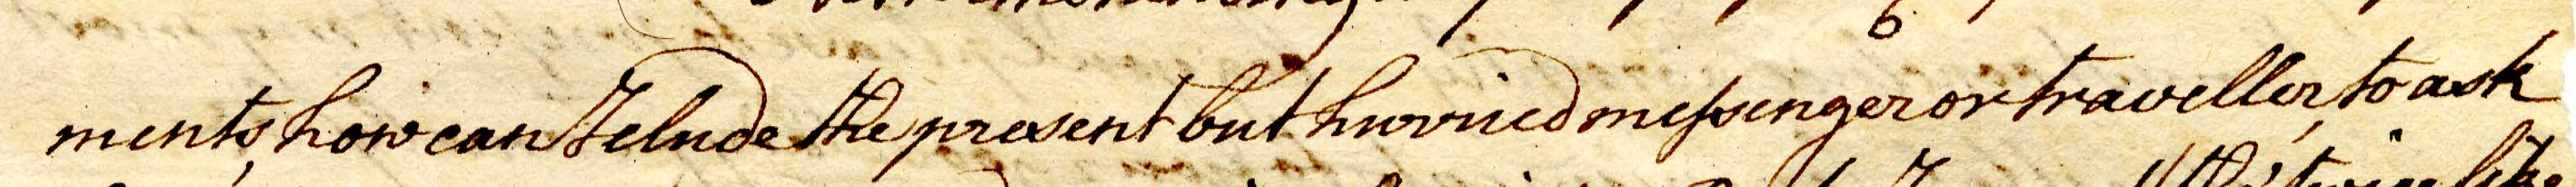ments, how can I elude the present but hurried messenger or traveller, to ask
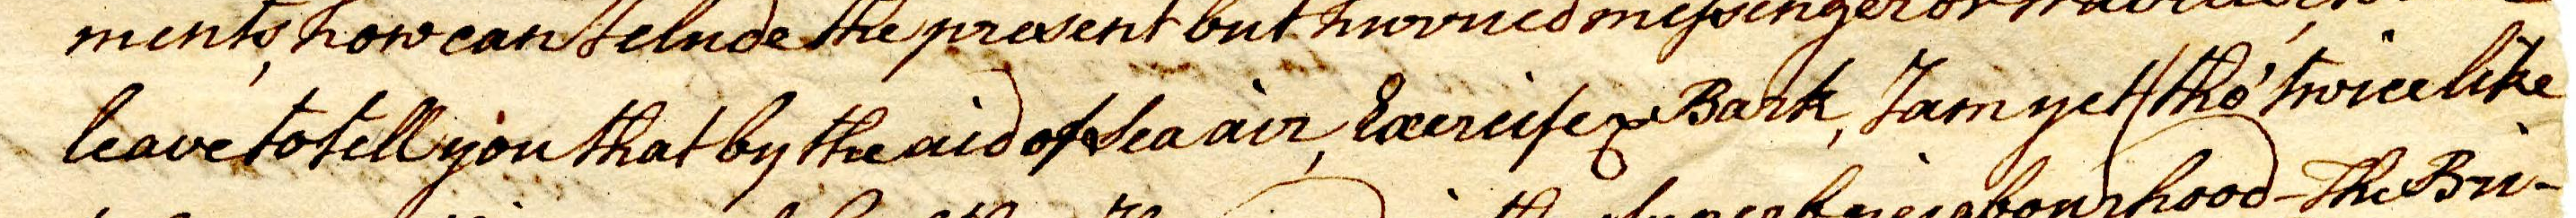leave to tell you that by the aid of sea air, Exercise & Bark, I am yet (tho' twice like
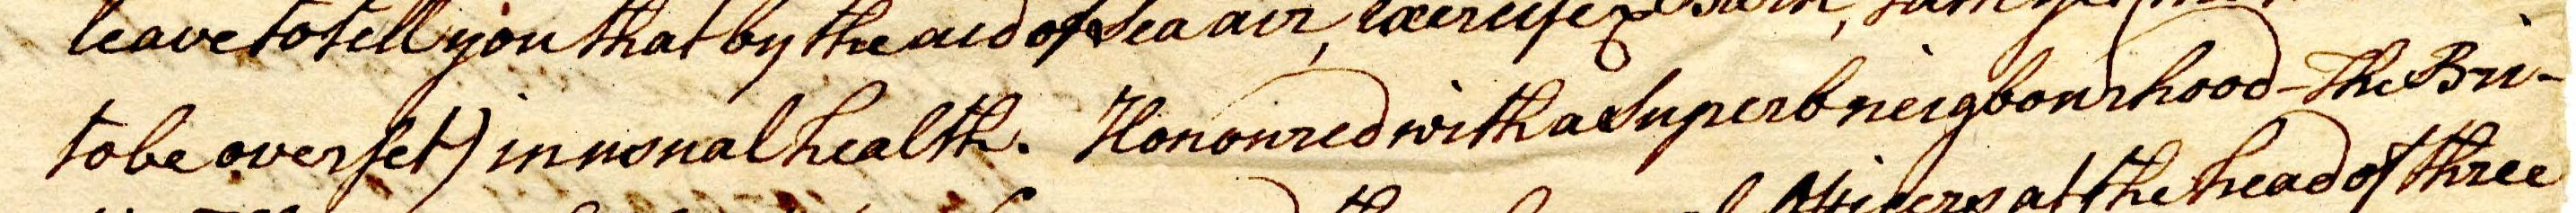to be over yet) in usual health. Honoured with a superb neighboyrhood the Bri-
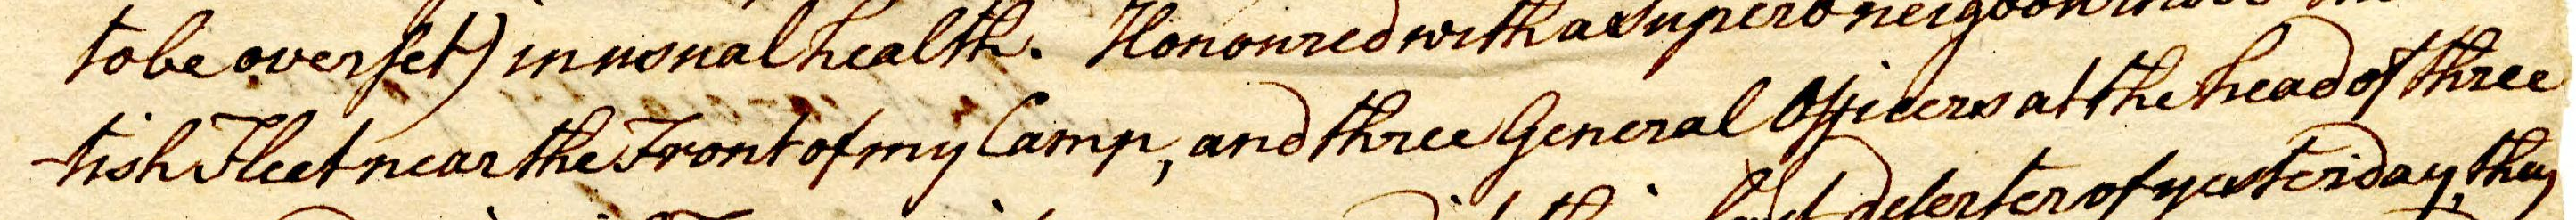-tish Fleet near the Front of my Camp, and three General Officers at the head of three
